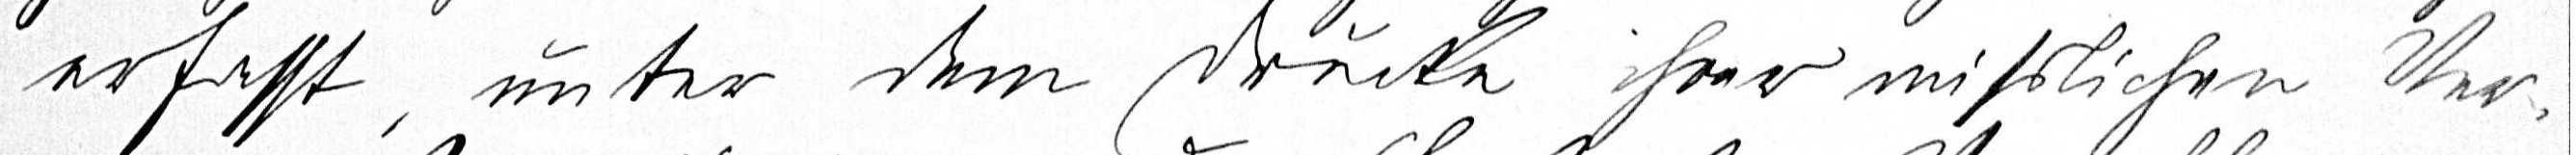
erfasst, unter dem Drucke ihrer misslichen Ver¬
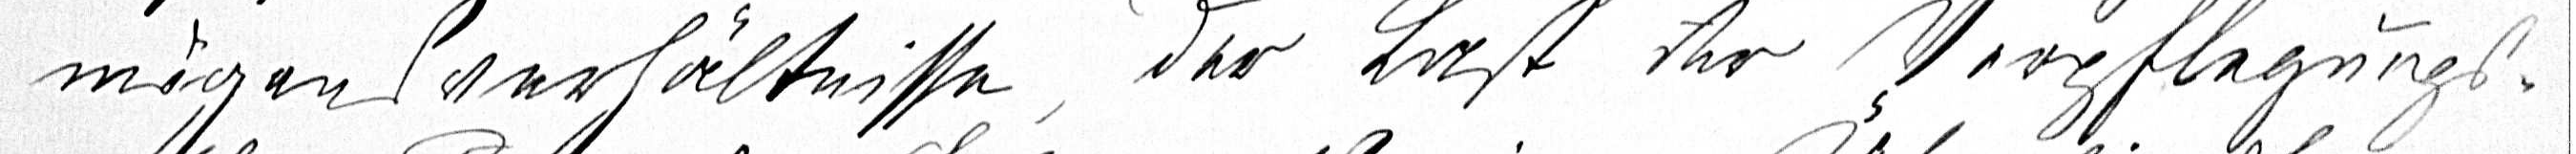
mögensverhältnisse, der Last der Verpflegungs¬
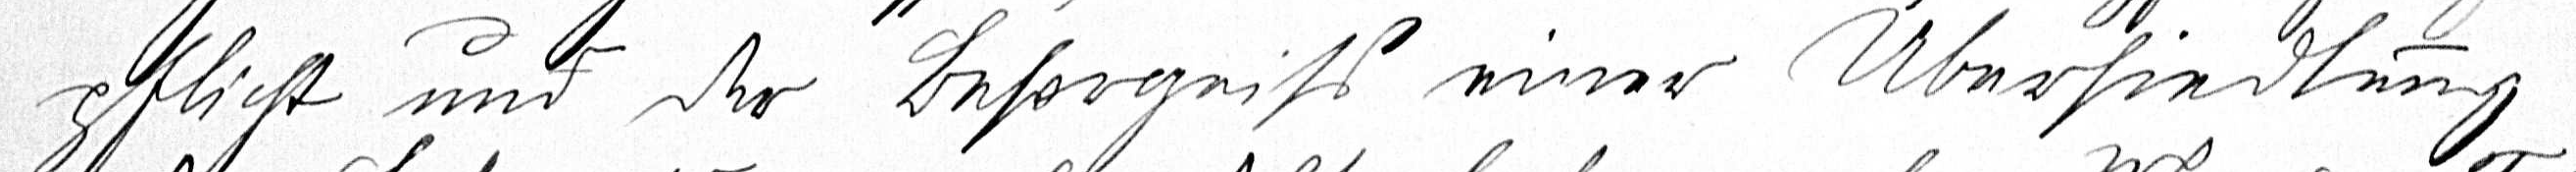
pflicht und der Besorgniß einer Übersiedlung
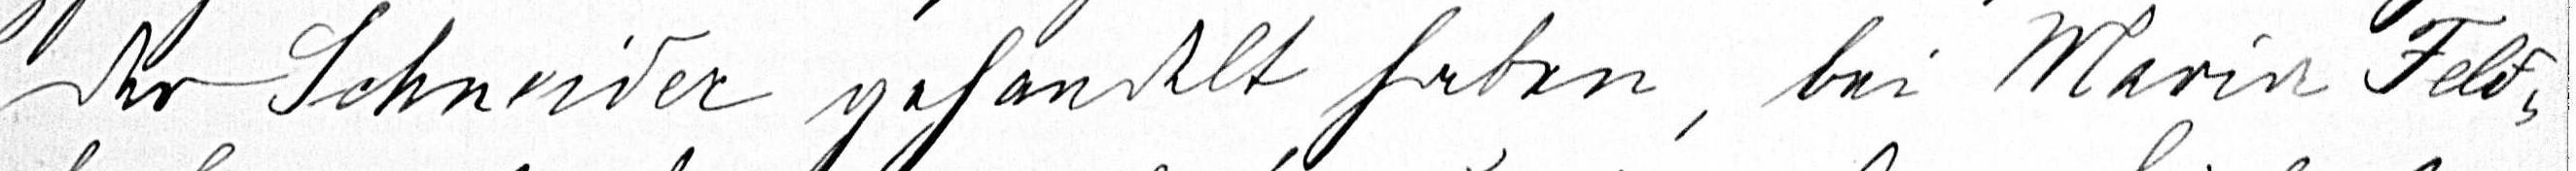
der Schneider gehandelt haben, bei Maria Feld¬
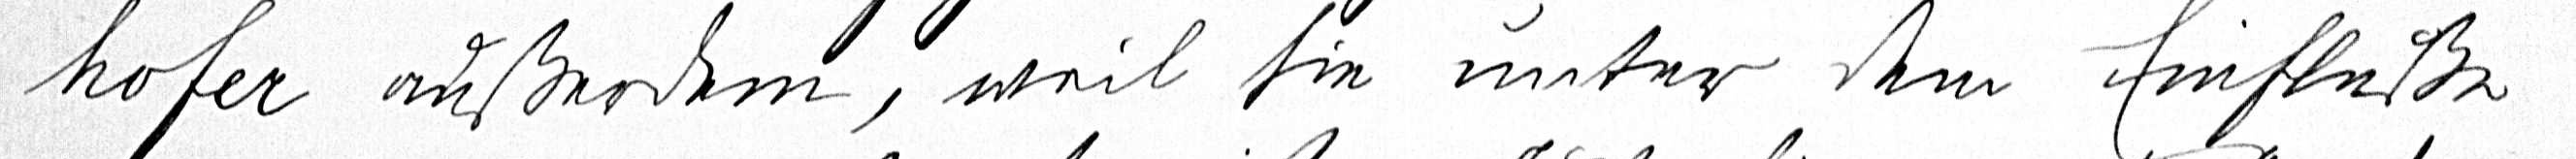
hofer außerdem, weil sie unter dem Einfluße
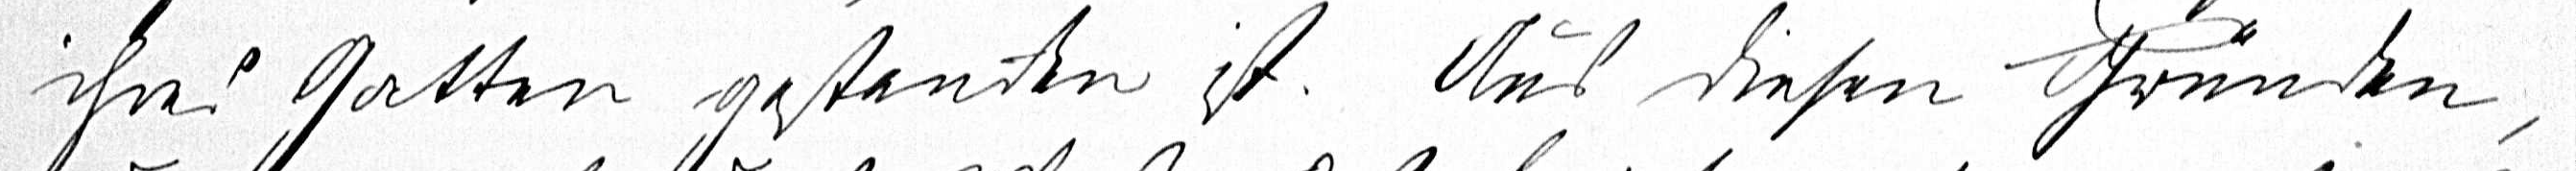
ihres Gatten gestanden ist. Aus diesen Gründen,
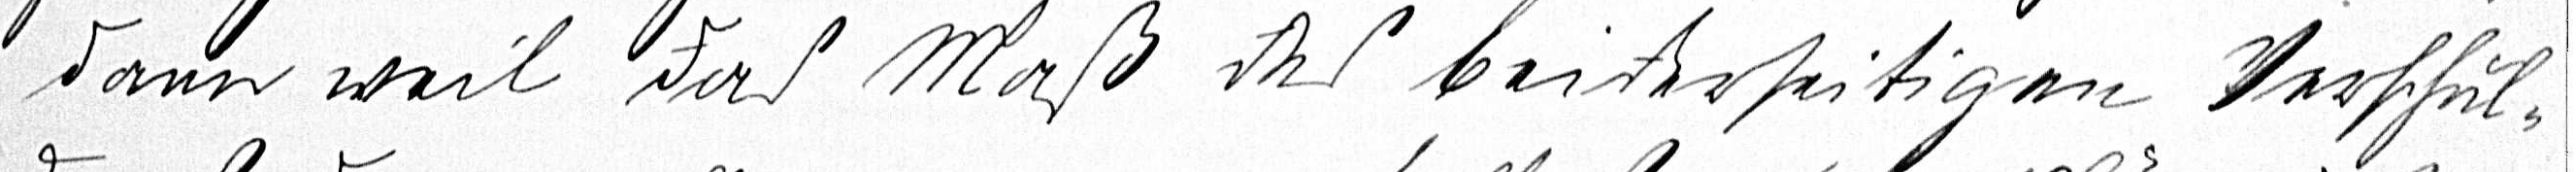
dann weil das Maß des beiderseitigen Verschul¬
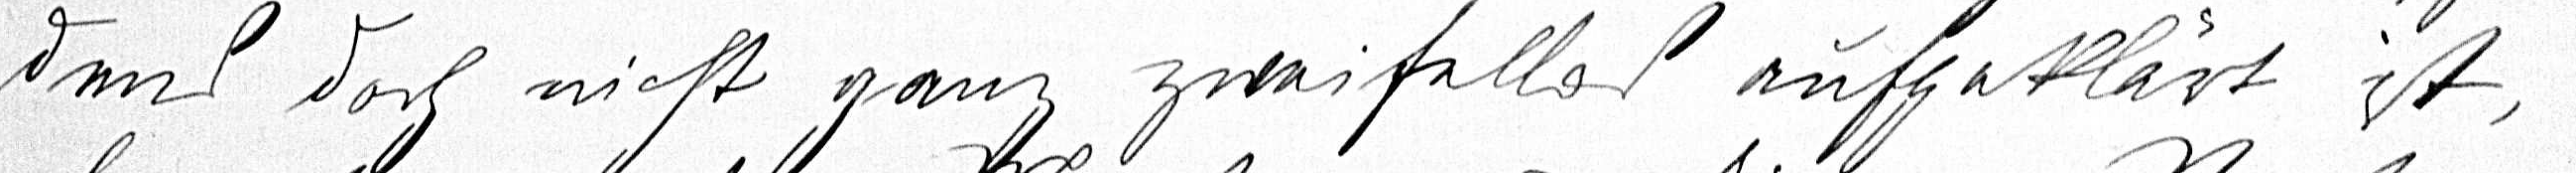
dens doch nicht ganz zweifellos aufgeklärt ist,
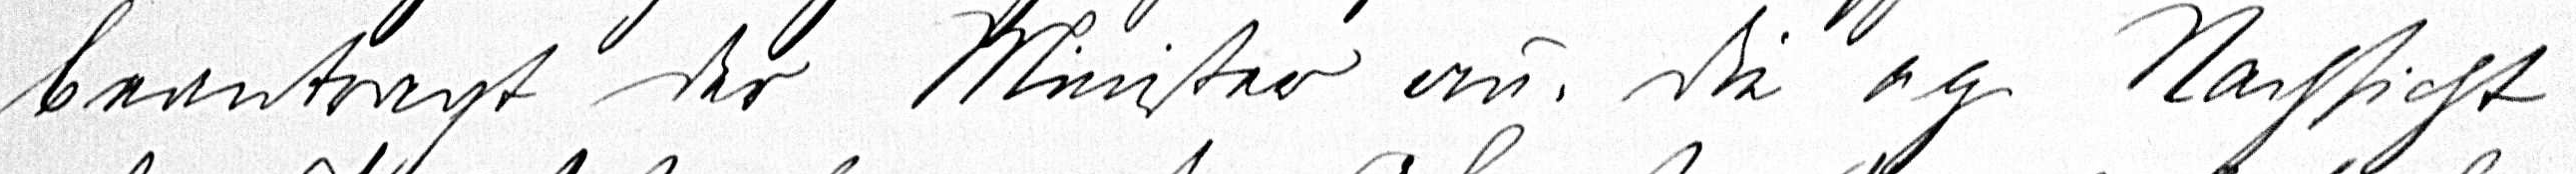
beantragt der Minister au. die ag. Nachsicht
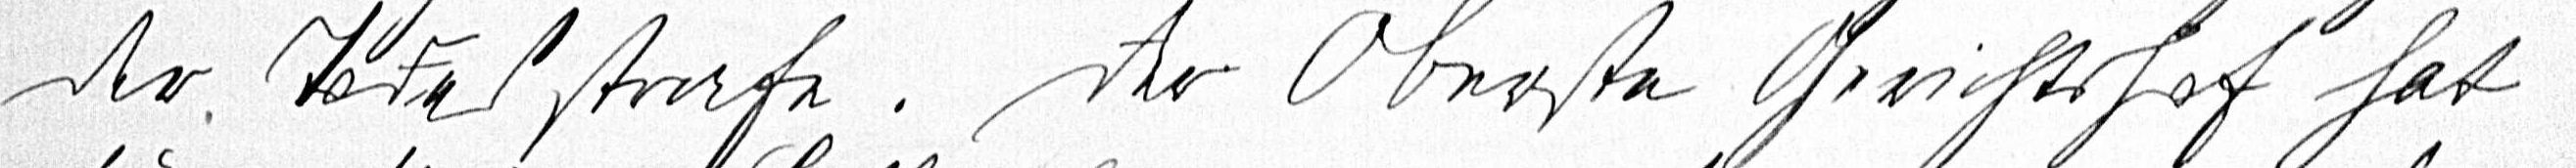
der Todesstrafe. Der Oberste Gerichtshof hat
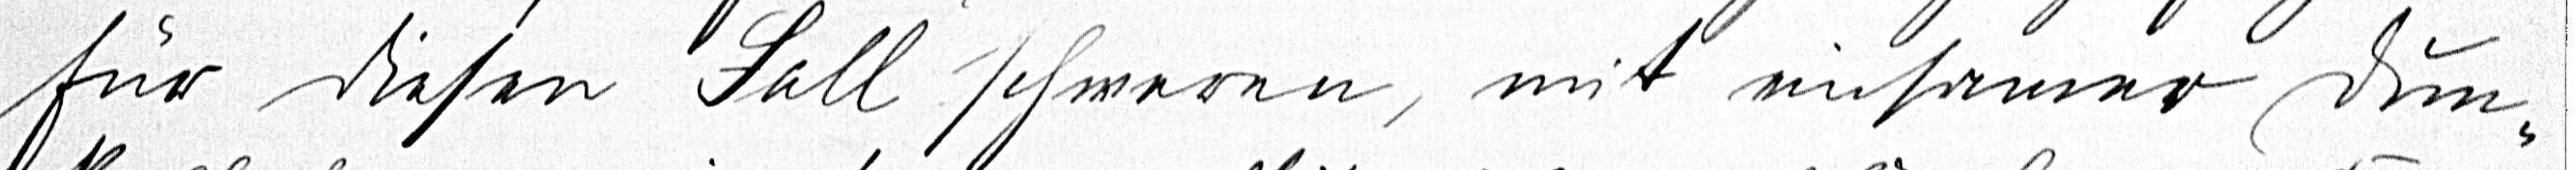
für diesen Fall schweren, mit einsamer Dun¬
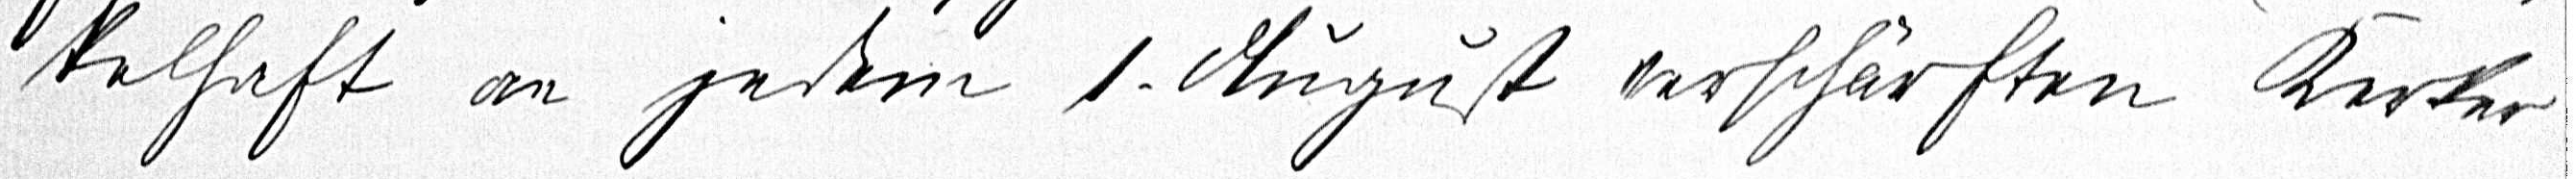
kelhaft an jedem 1. August verschärften Kerker
